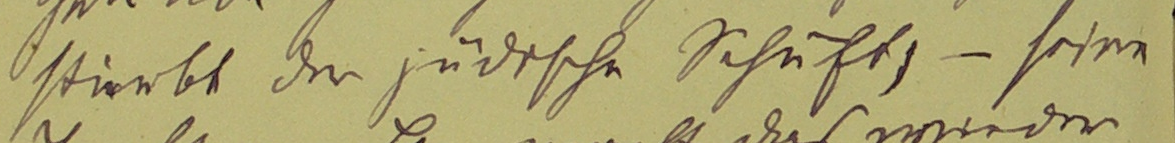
stirbt der jüdische Schuft. -Seine
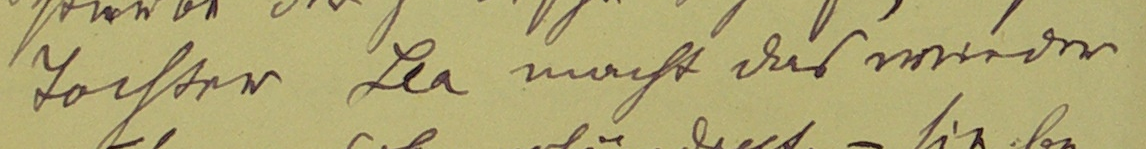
Tochter Lea macht das wieder
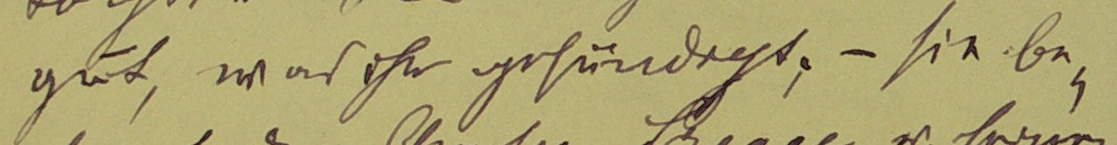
gut , was er gesündigt.- Sie be¬
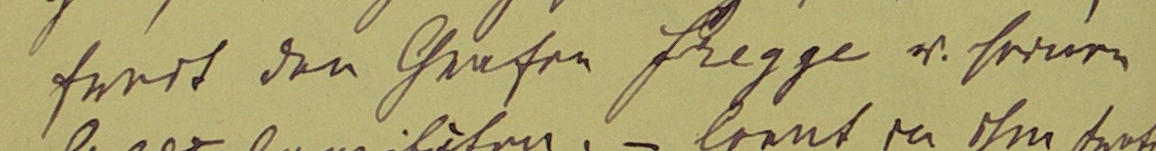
freit den Grafen Fregge von seinen
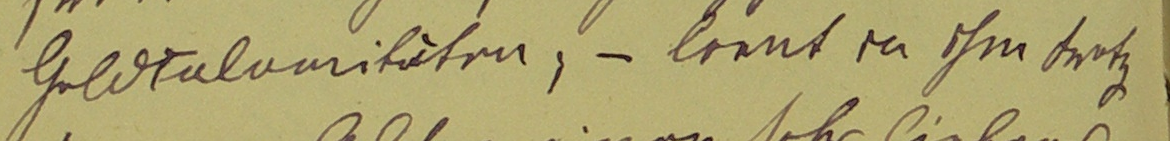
Geldkalamitäten;- lernt in ihm trotz
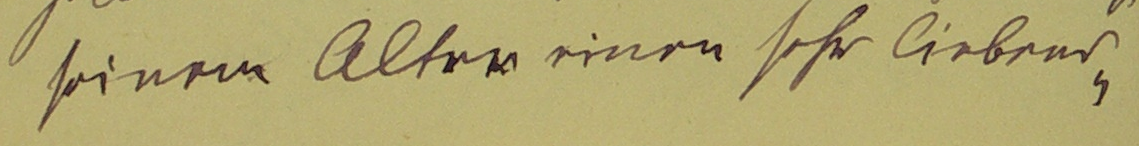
seinem Alter einen sehr liebens..,
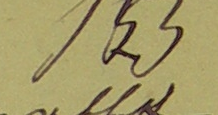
152
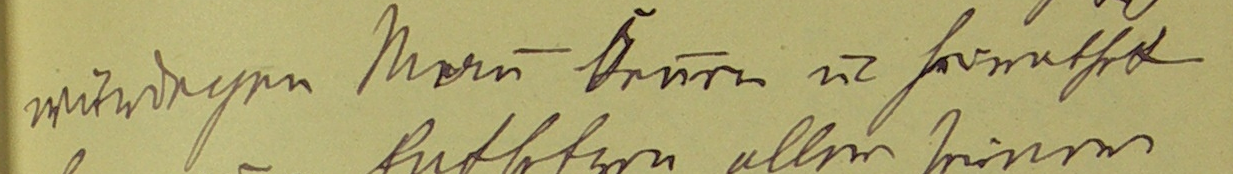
wdürdigen Mann kennen und heirathet
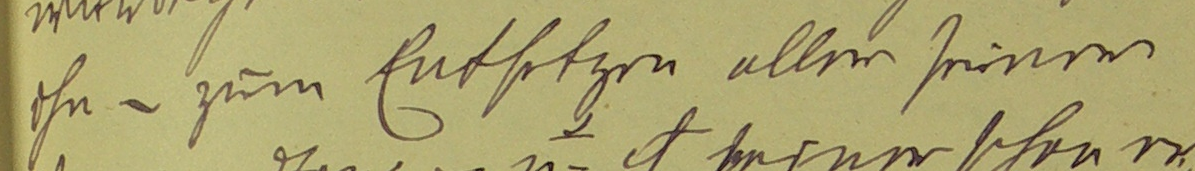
ihn zum Entsetzen aller seiner
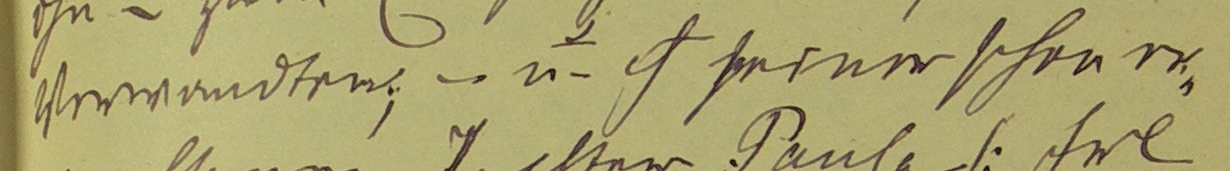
Verwandten un auch seiner schon er¬
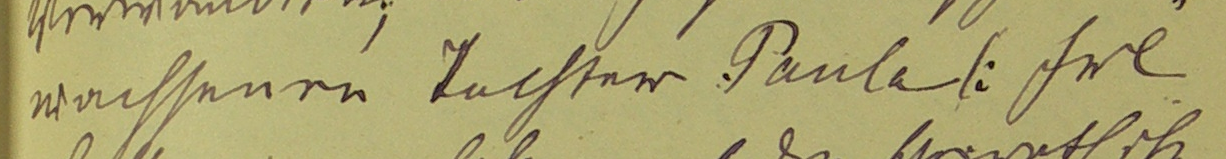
wachsenen Tochter Paula. (: Frl.
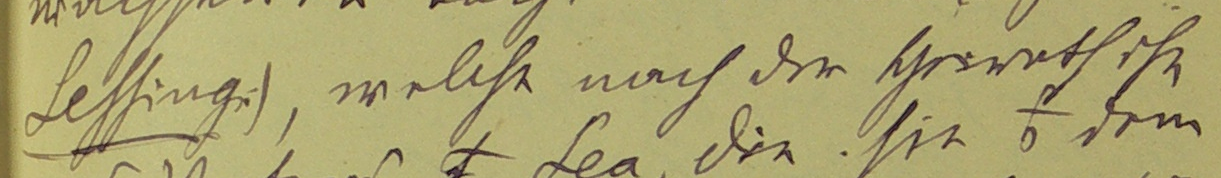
Lessing : ) , welche nach der Heirat ih
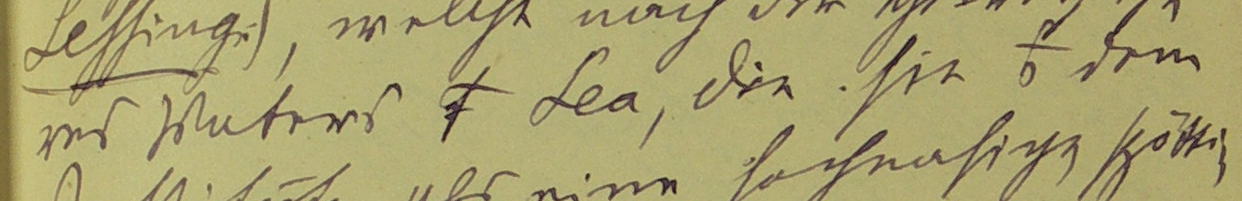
res Vaters mit Lea, die sie aus dem
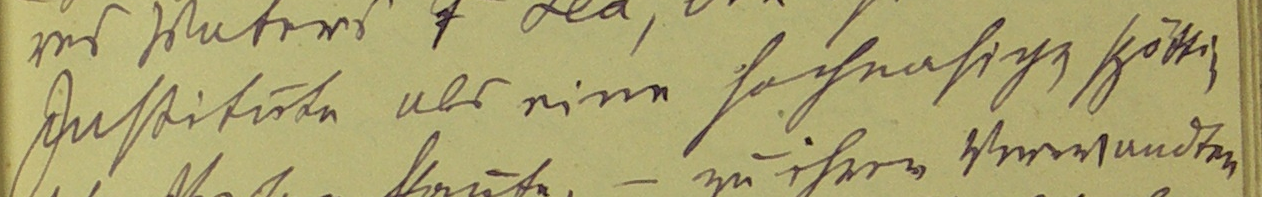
Institute als eine hochnasige, spötti¬
